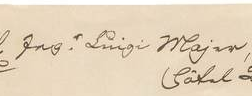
Ingr Luigi Majer,
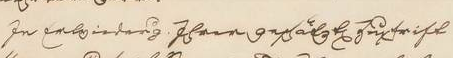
In Erwieder[un]g Ihrer geschätzten Zuschrift
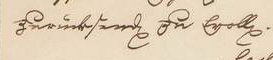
zurücksenden zu wollen.
